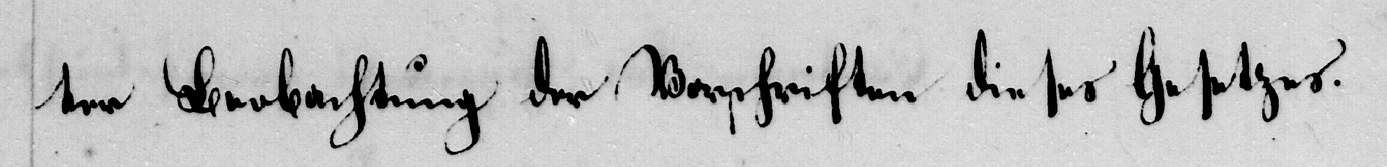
ter Beobachtung der Vorschriften dieses Gesetzes.
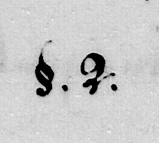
§.2.
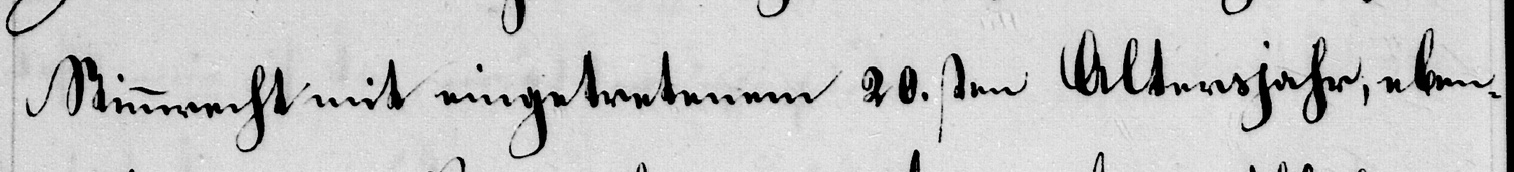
Stimmrecht mit eingetretenem 20.sten Altersjahr, eben¬
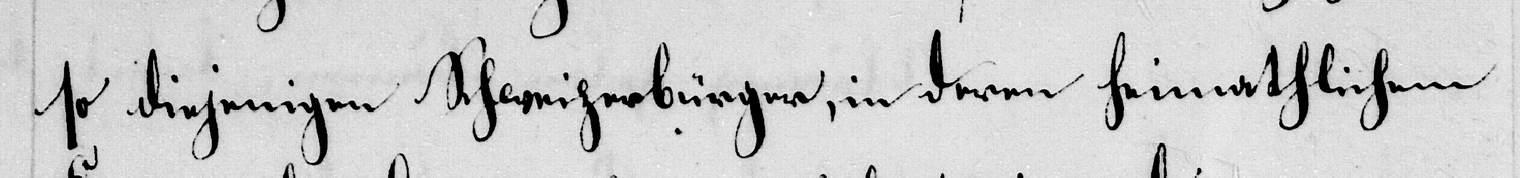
so diejenigen Schweizerbürger, in deren heimathlichem
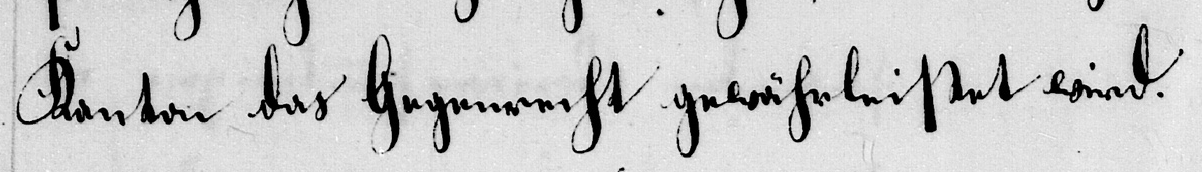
Kanton das Gegenrecht gewährleistet wird.
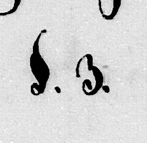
§.3.
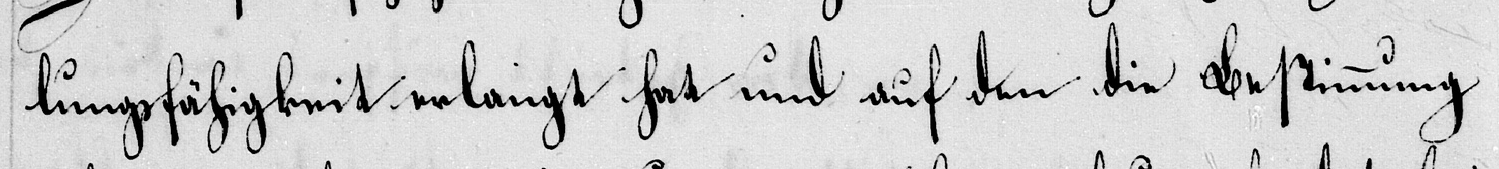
lungsfähigkeit erlangt hat und auf den die Bestimmung
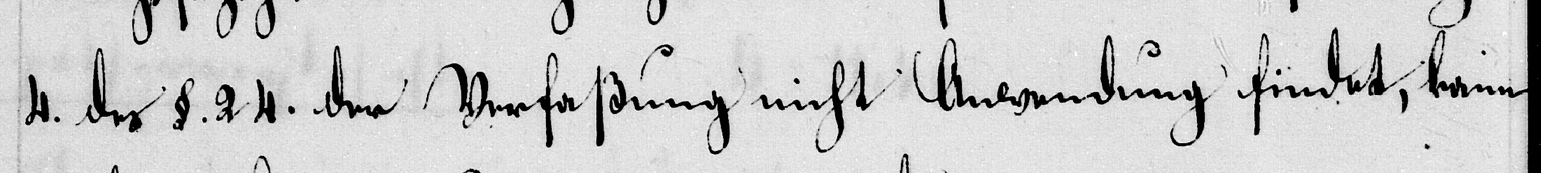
4. des §. 24. der Verfaßung nicht Anwendung findet, kann
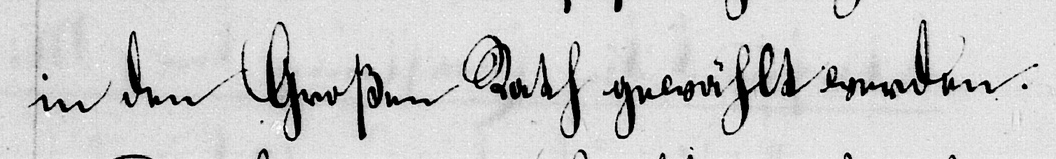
in den Großen Rath gewählt werden.
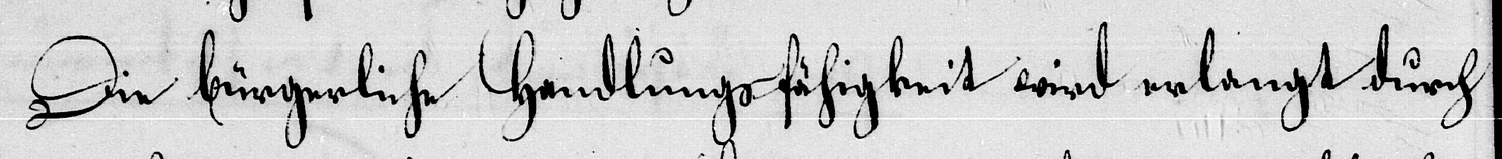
Die bürgerliche Handlungsfähigkeit wird erlangt durch
